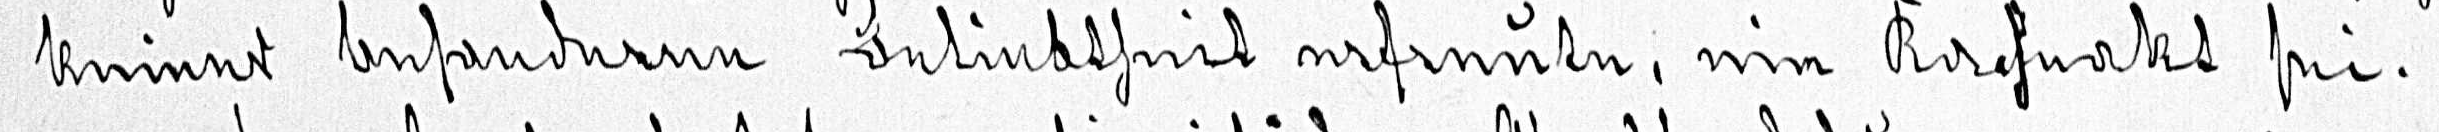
keiner besonderen Beliebtheit erfreute, ein Racheakt sei.
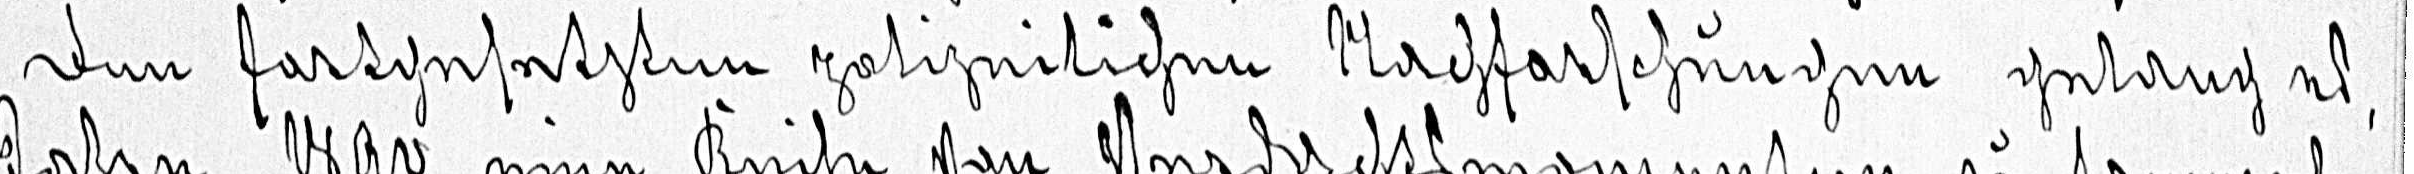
Den fortgesetzten polizeilichen Nachforschungen gelang es,
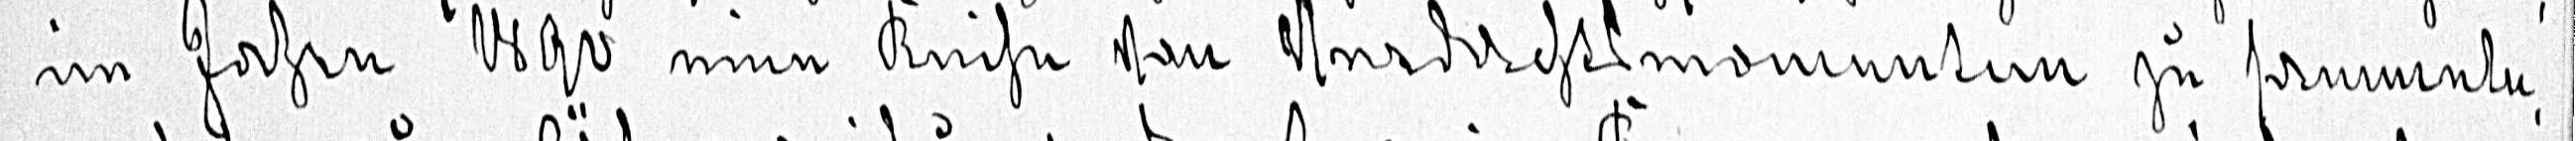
im Jahre 1890 eine Reihe von Verdachtsmomenten zu sammeln,
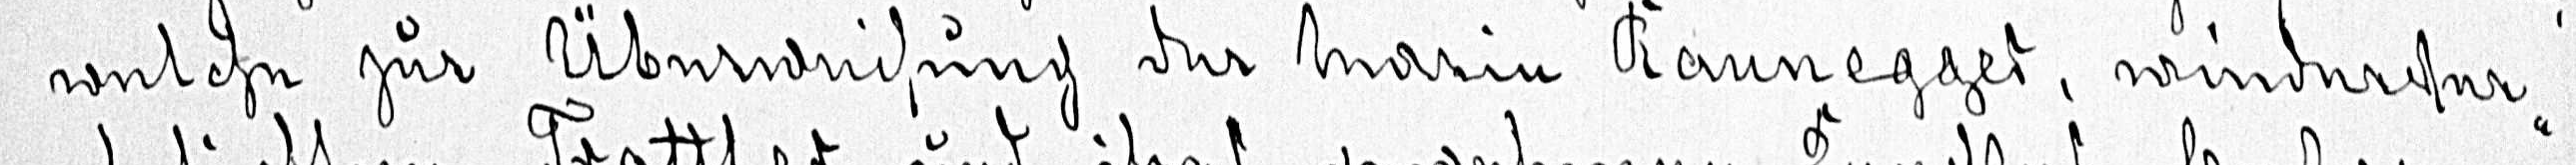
welche zur Überweisung der Marie Raunegger, wiederver¬
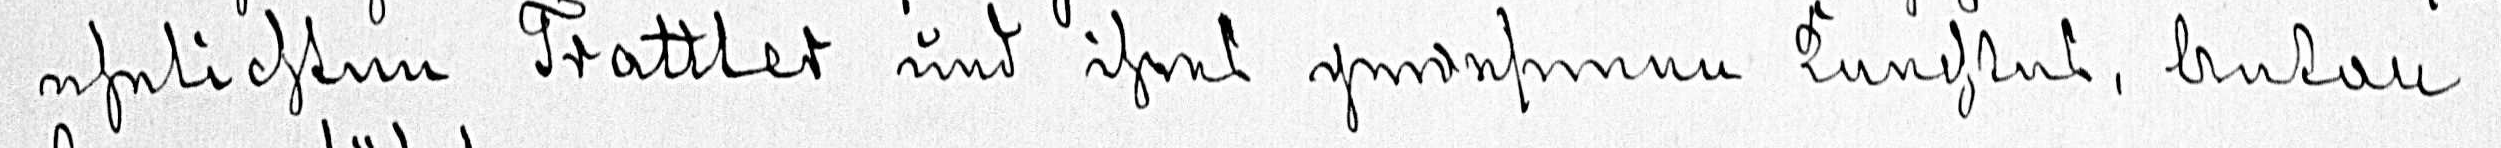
ehelichten Trattler und ihres gewesenen Knechtes, Anton
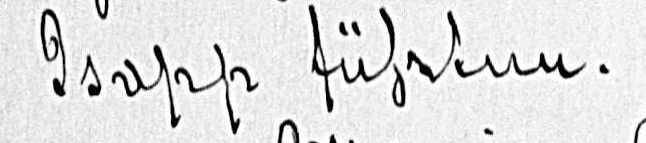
Isopp führten.
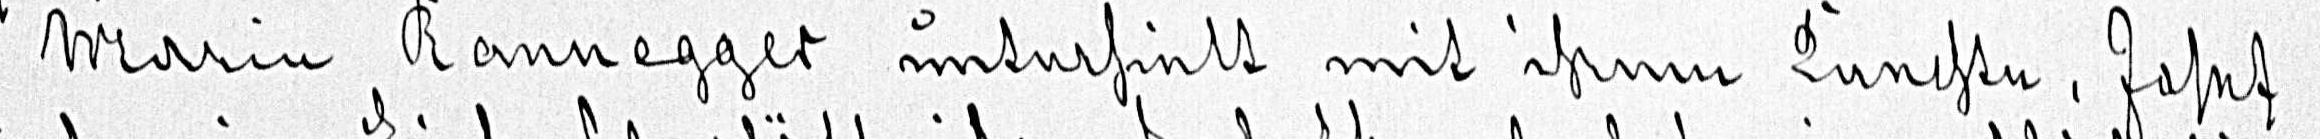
Marie Raunegger unterhielt mit ihrem Knechte, Josef
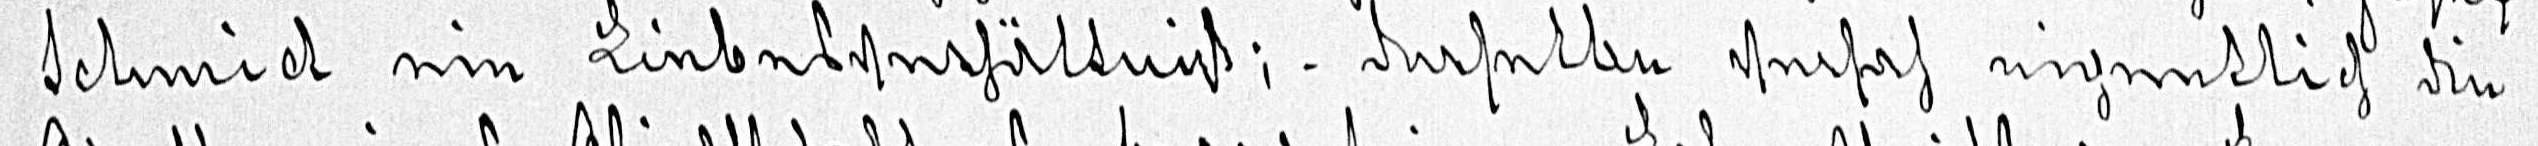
Schmid ein Liebesverhältniß; derselbe versah eigentlich die
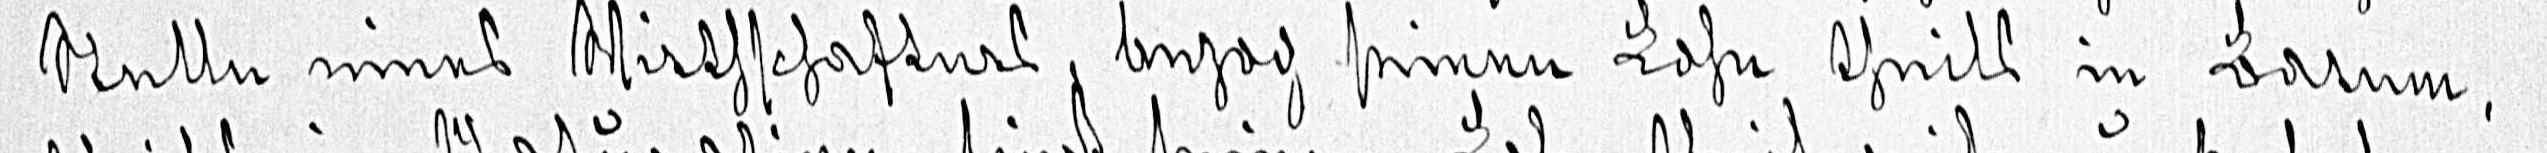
Stelle eines Wirthschafters bezog seinen Lohn theils in Barem,
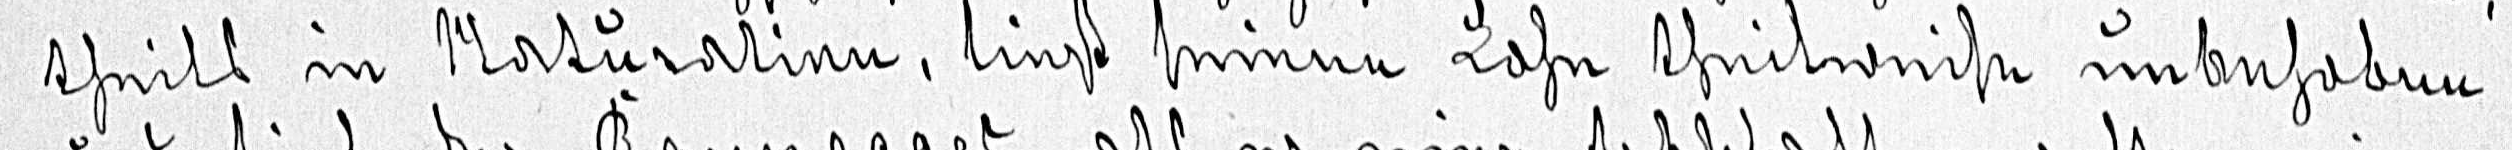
theils in Naturalien, ließ seinen Lohn theilweise unbehoben
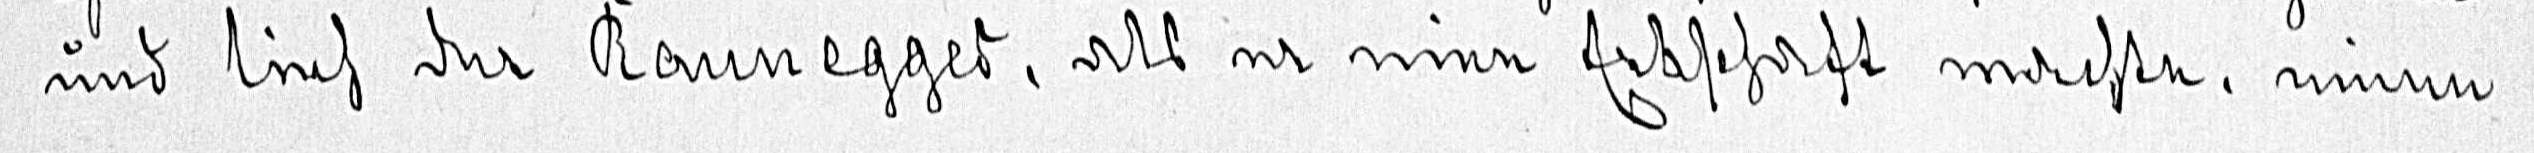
und lieh der Raunegger, als er eine Erbschaft machte, einen
